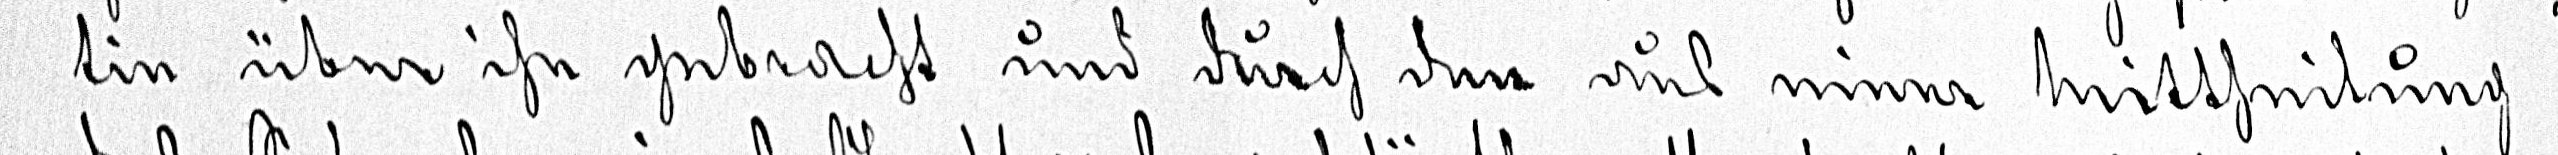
tin über ihn gebracht und durch den aus einer Mittheilung
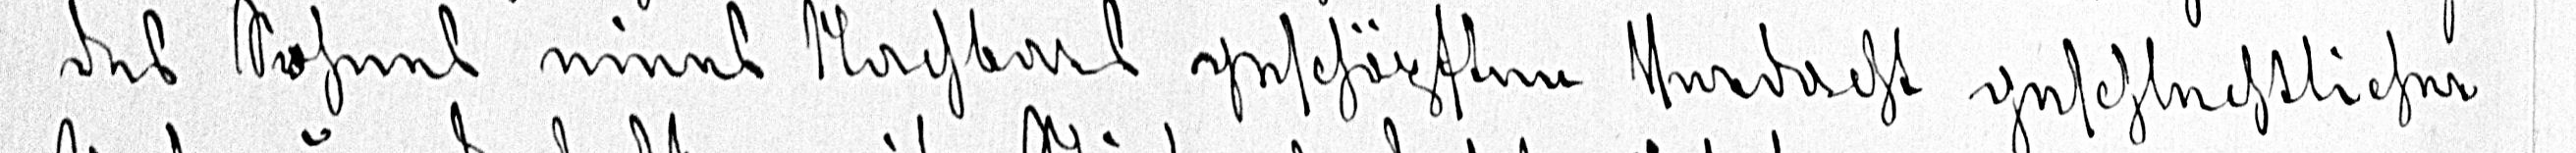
des Sohnes eines Nachbars geschöpften Verdacht geschlechtlicher
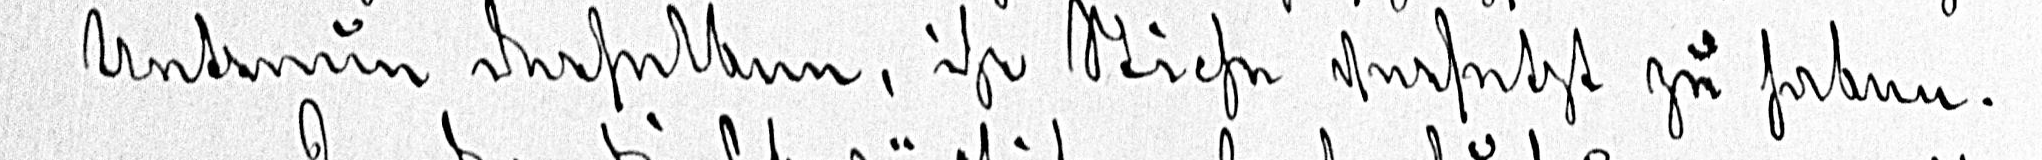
Untreue derselben, ihr Stiche versetzt zu haben.
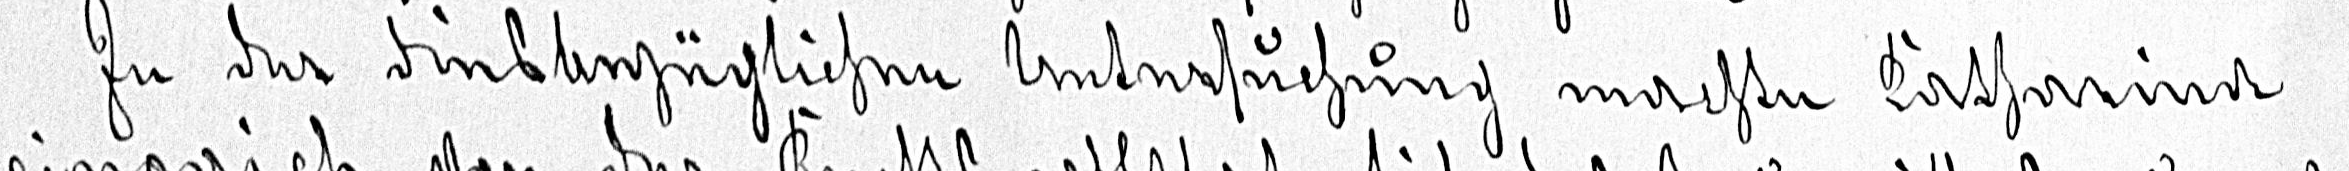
In der diesbezüglichen Untersuchung machte Katharina
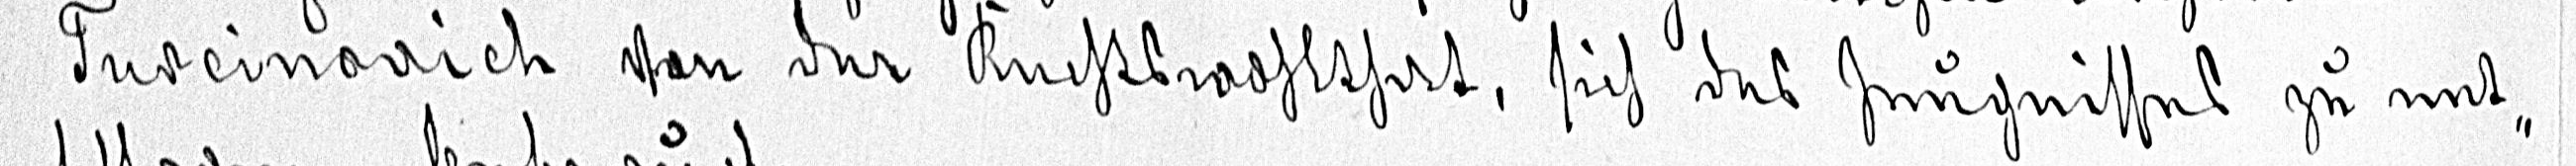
Turcinovichvon der Rechtswohlthat, sich des Zeugnisses zu ent¬
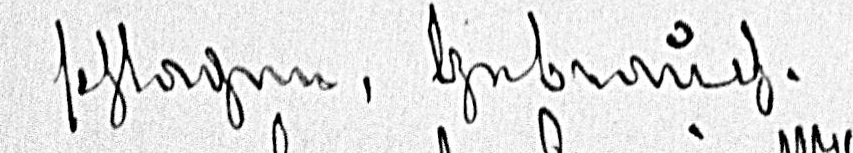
schlagen, Gebrauch.
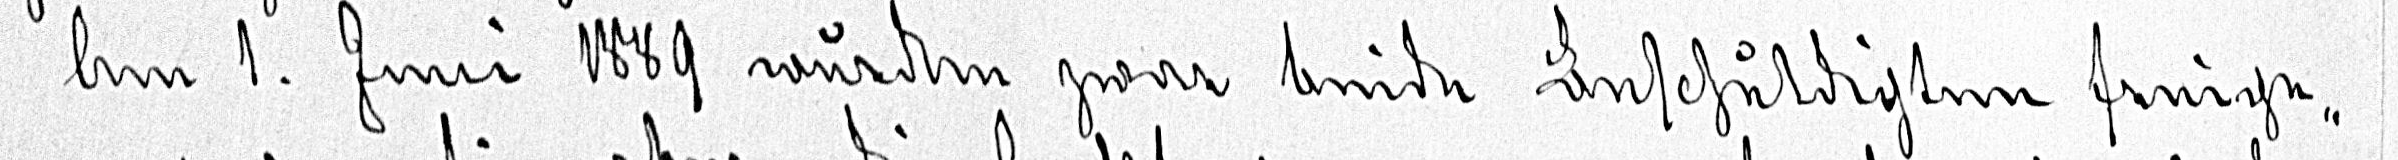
Am 1. Juni 1889 wurden zwar beide Beschuldigten freige¬
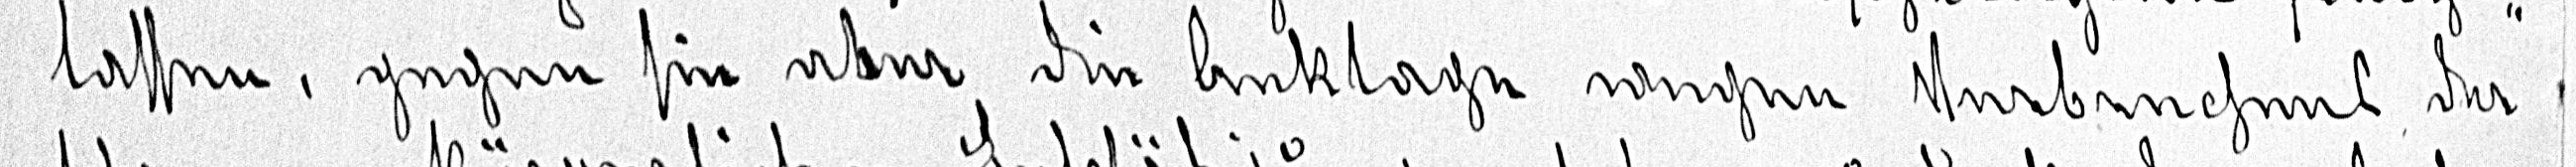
lassen, gegen sie aber die Anklage wegen Verbrechens der
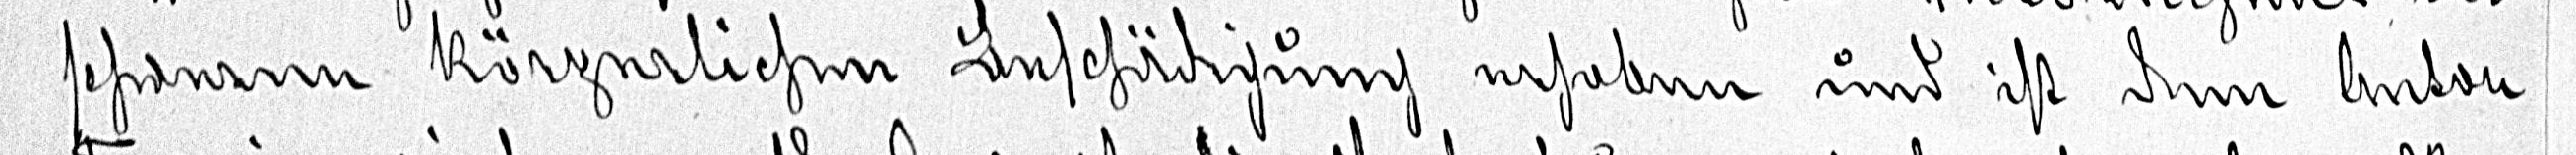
schweren körperlichen Beschädigung erhoben und ist dem Anton
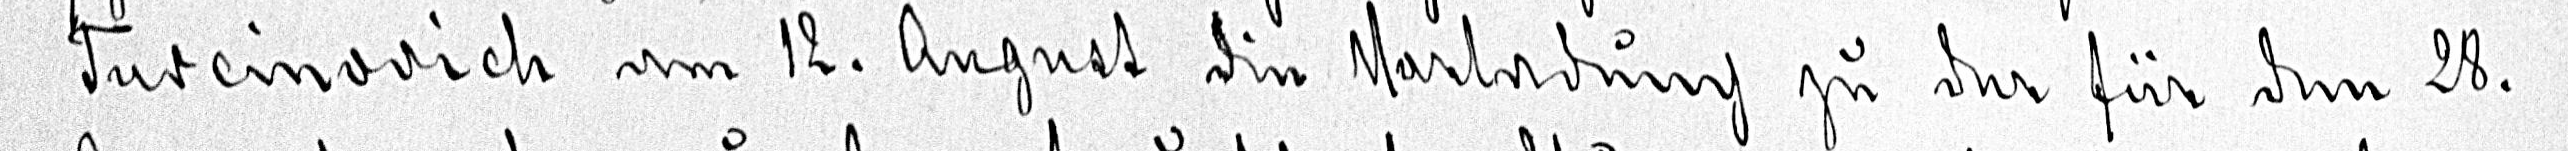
Turcinovich am 12. August die Vorladung zu der für den 28.
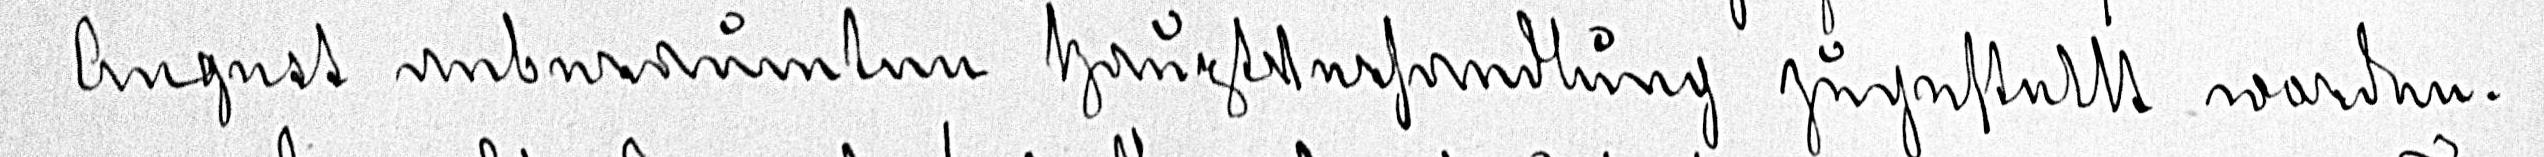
August anberaumten Hauptverhandlung zugestellt worden.
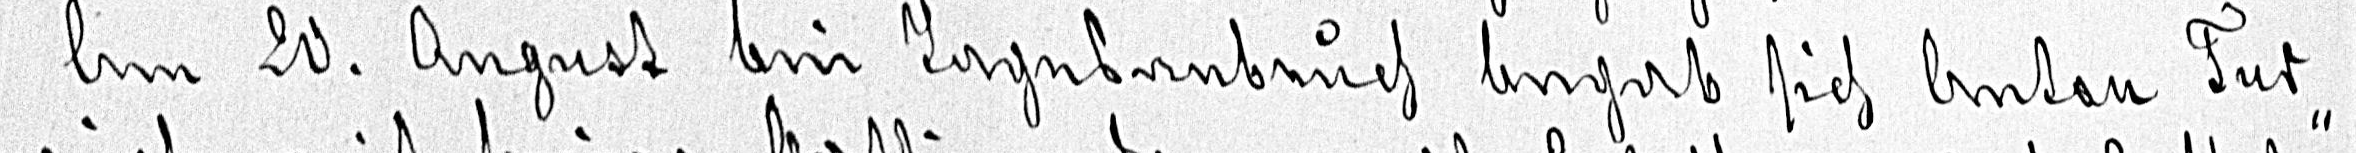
Am 20. August bein Tagesanbruch begab sich Anton Tur¬
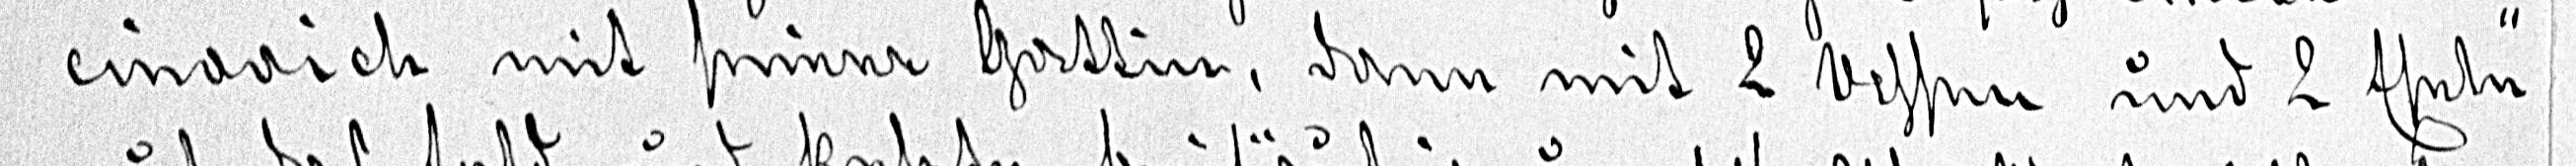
cinovich mit seiner Gattin, dann mit 2 Ochsen und 2 Eseln
